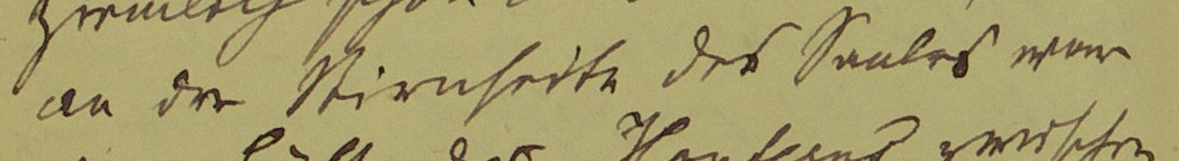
An der Stirnfront des Saales war
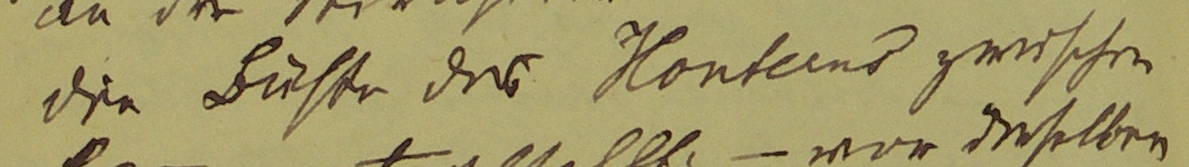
die Büste des Honterus zwischen
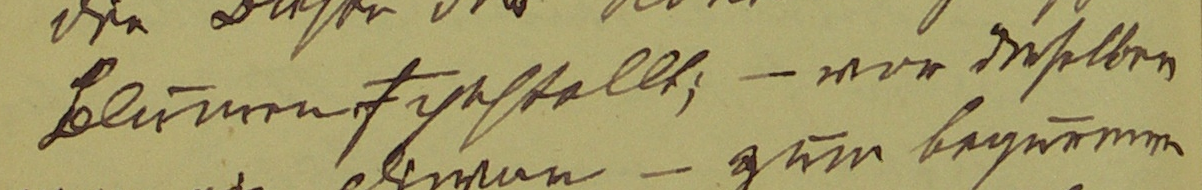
Blumen gestellt.- vor derselben
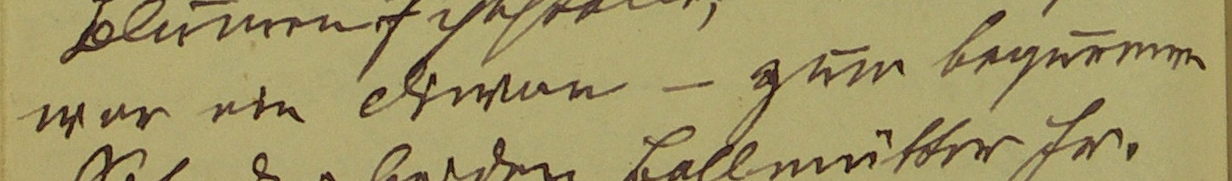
war ein Diwan zum bequemen
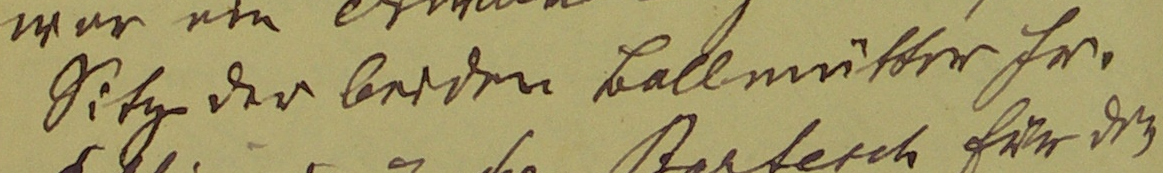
Sitz der beiden Ballmütter Fr. ?
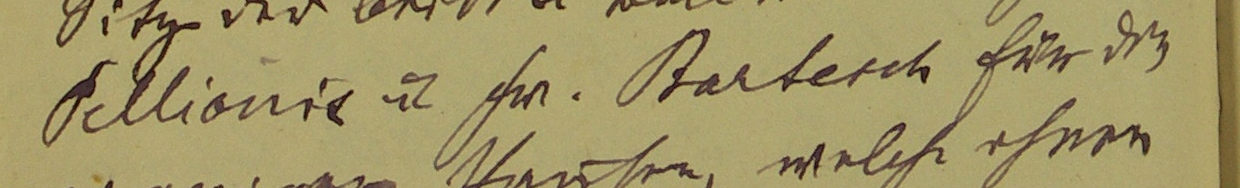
Sellionis und Fr.Bartesch für die
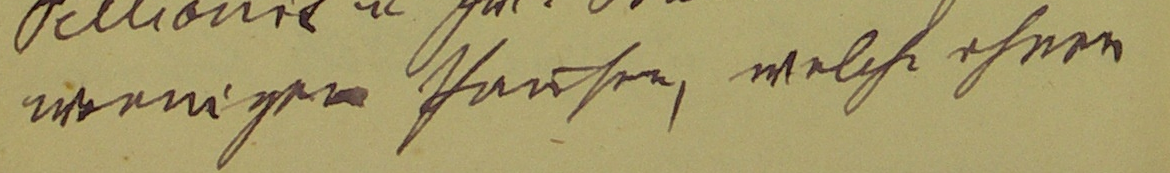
wenigen Pausen, welche ihnen
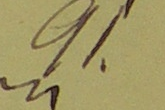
91
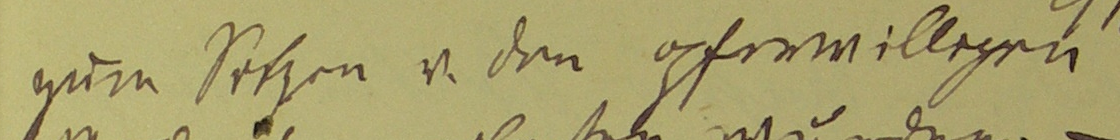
zum Sitzen von den opferwilligen
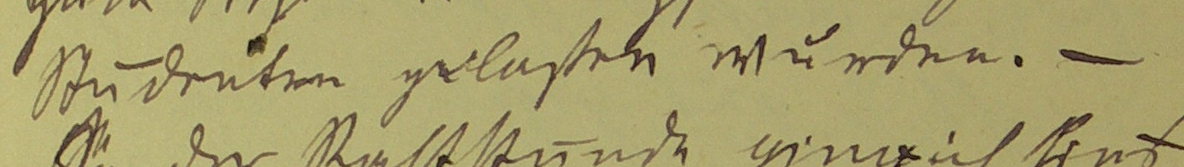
Studenten gelassen wurden.-
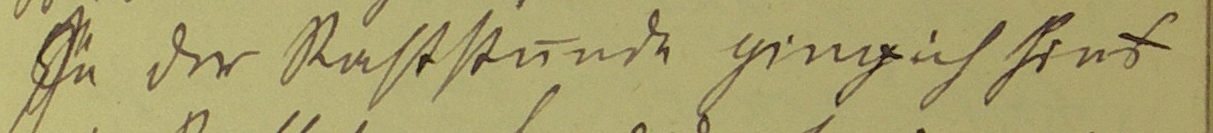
In der Raststunde ging ich hinaus
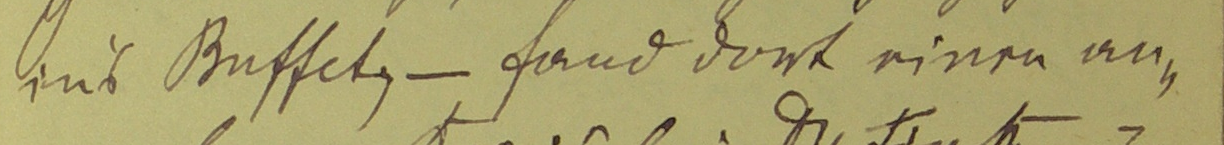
ins Buffet, - fand dort einen an¬
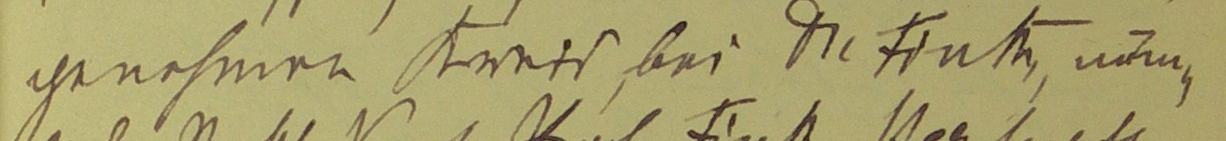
genehmen Kreis, bei Dr. Fink, näm¬
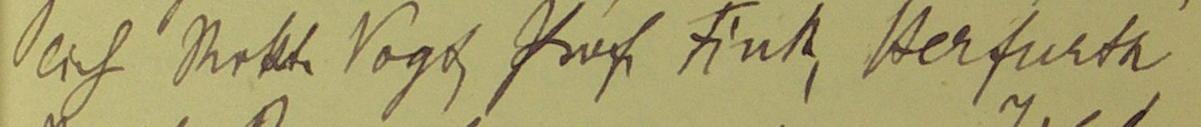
lich Rekt. Vogt, Prof. Fink, Herfurth,
